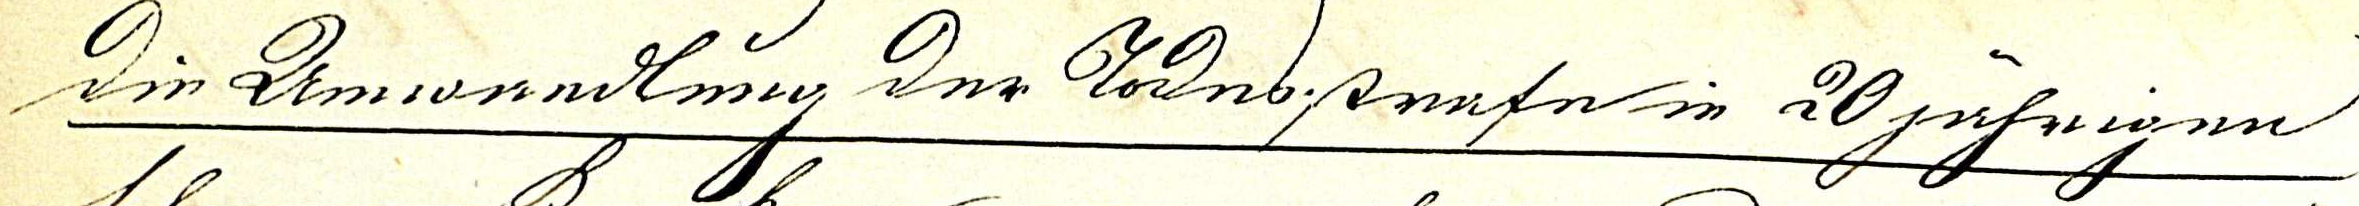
die Umwandlung der Todesstrafe in 20jährigen
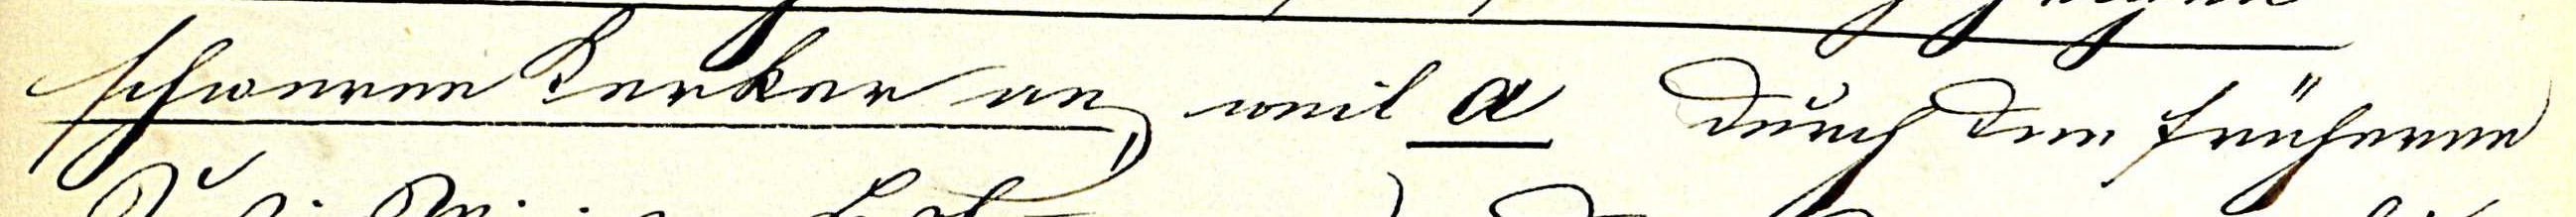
schweren Kerker an weil A durch den früheren
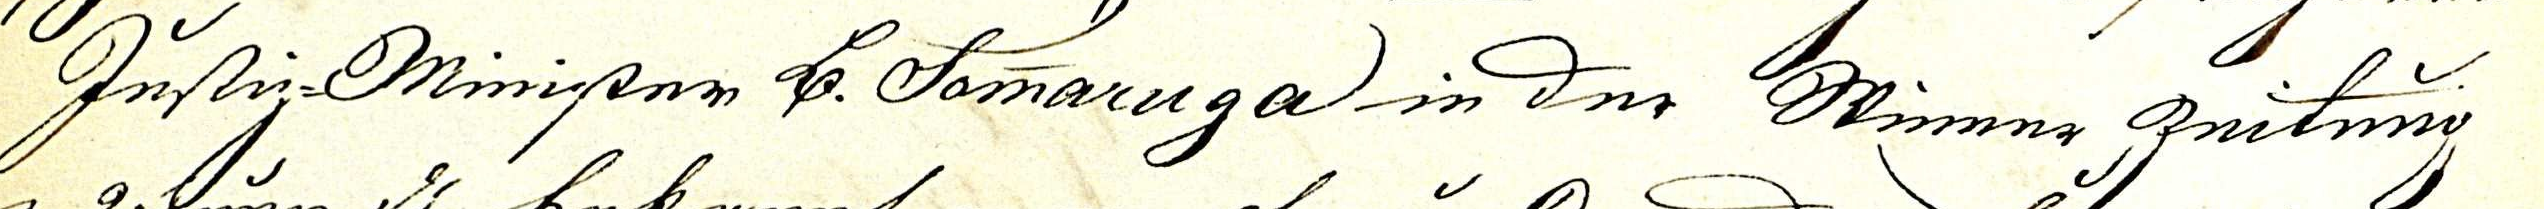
Justiz-Minister B. Sommaruga in der Wiener Zeitung
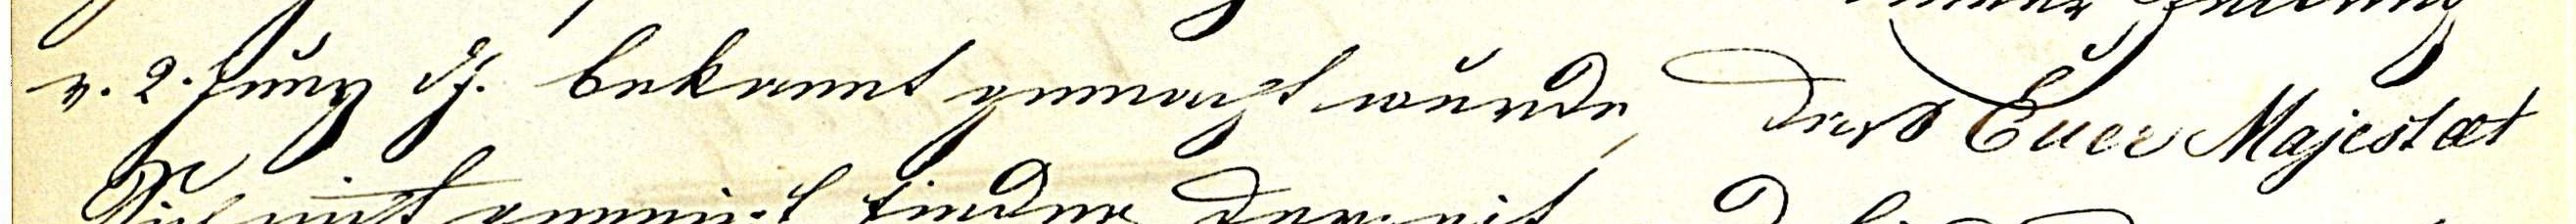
v. 2. Juny Ah bekannt gemacht wurde, daß Euer Majestaet
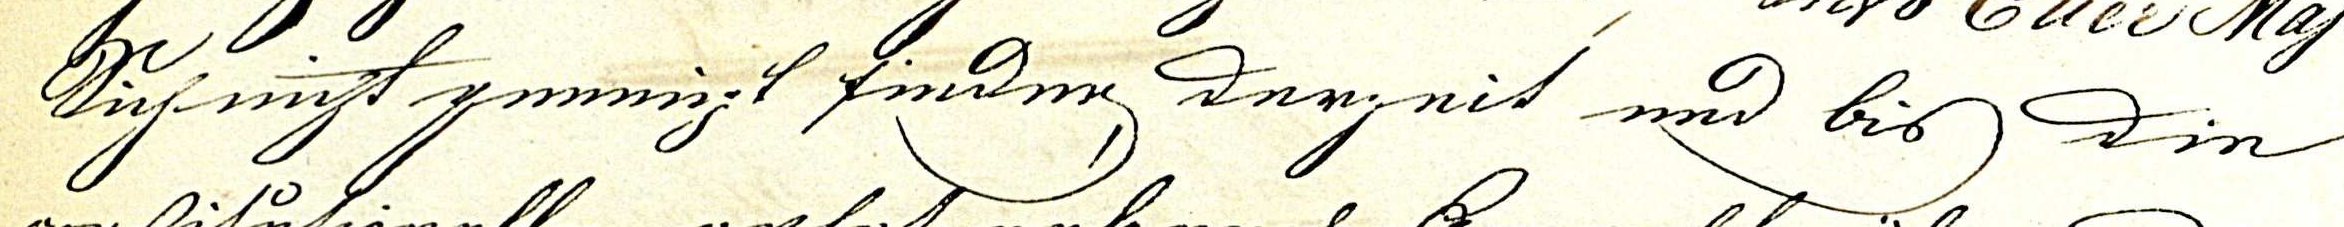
Sich nicht geneigt finden, derzeit und bis die
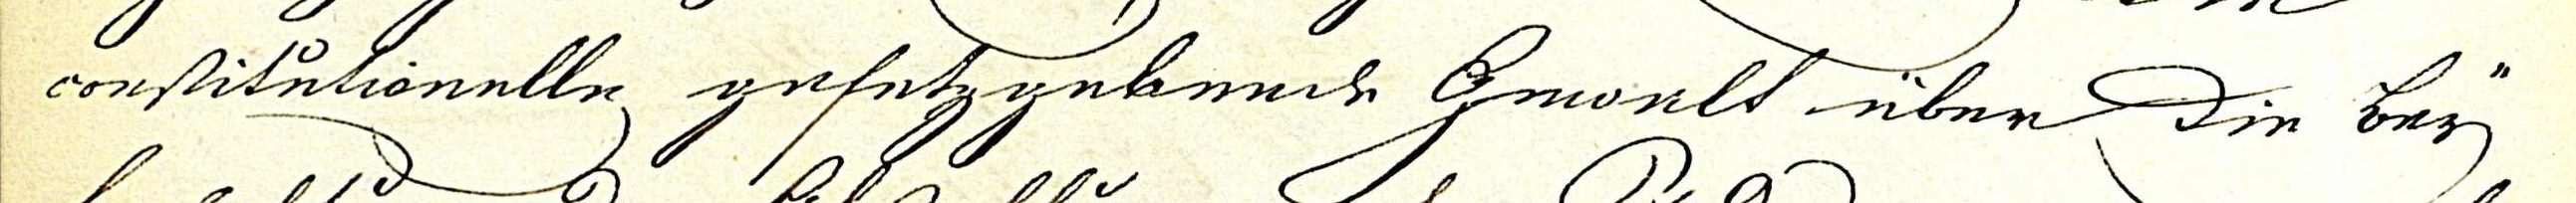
constitutionelle gesetzgebende Gewalt über die Bey
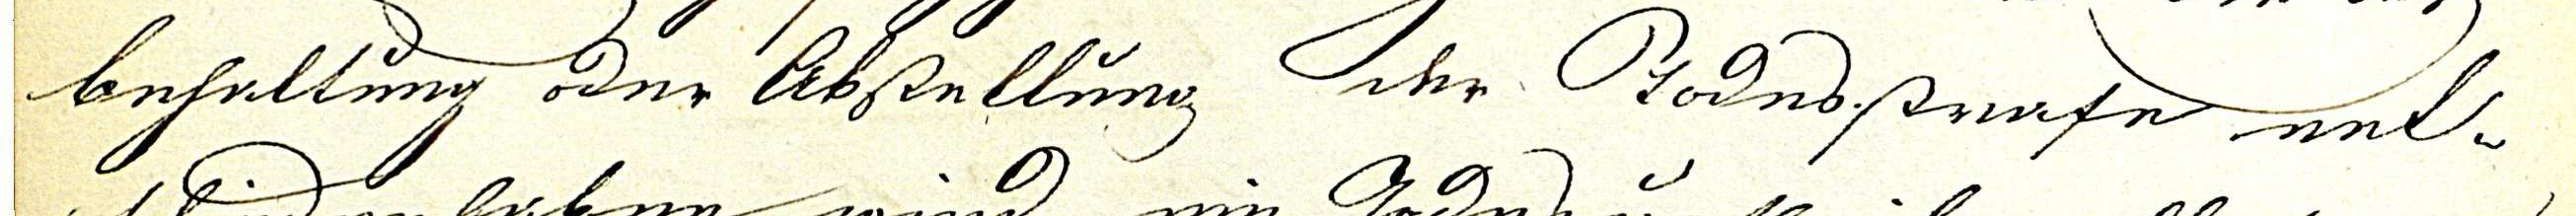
behaltung oder Abstellung der Todesstrafe ent¬
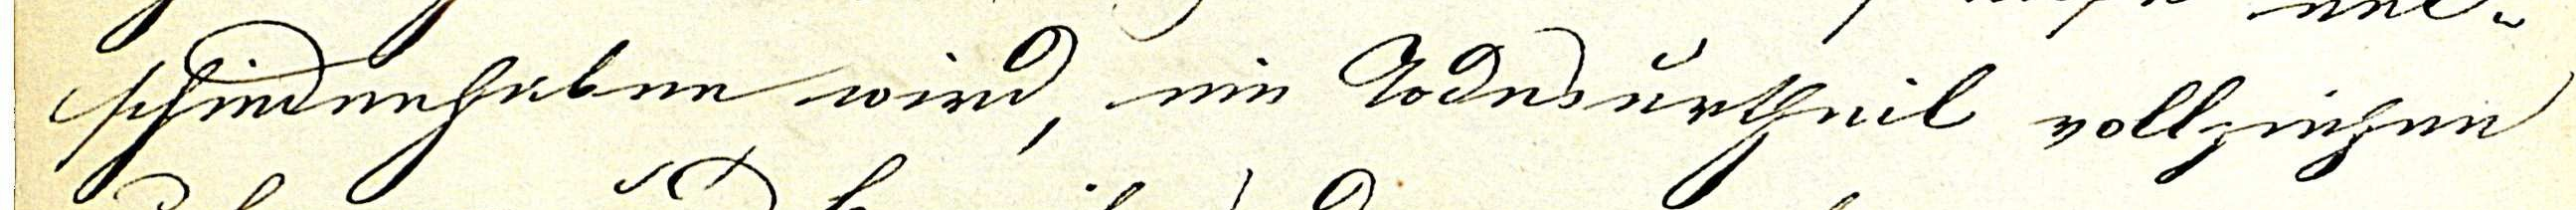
schieden haben wird, ein Todesurtheil vollziehen
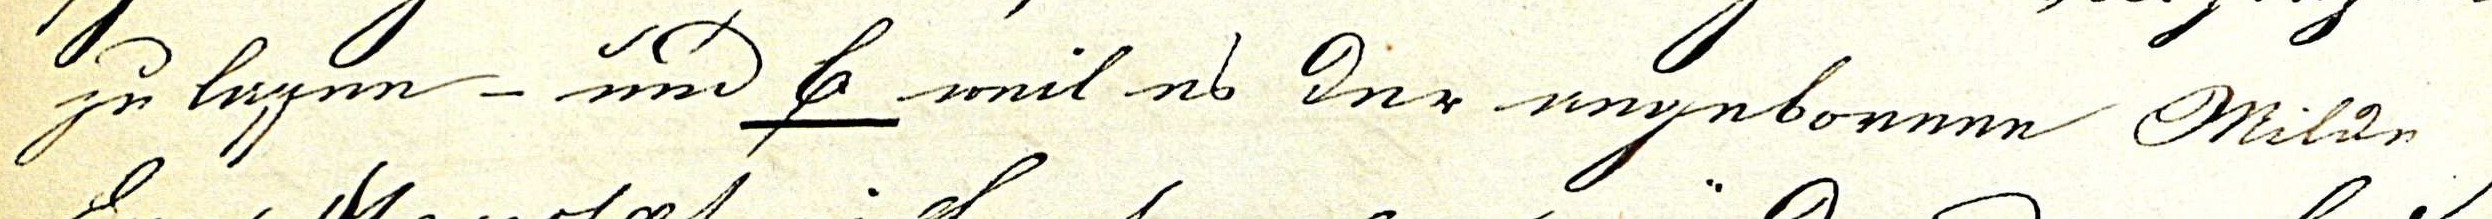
zu lassen – du B weil es der angebeorene Milde
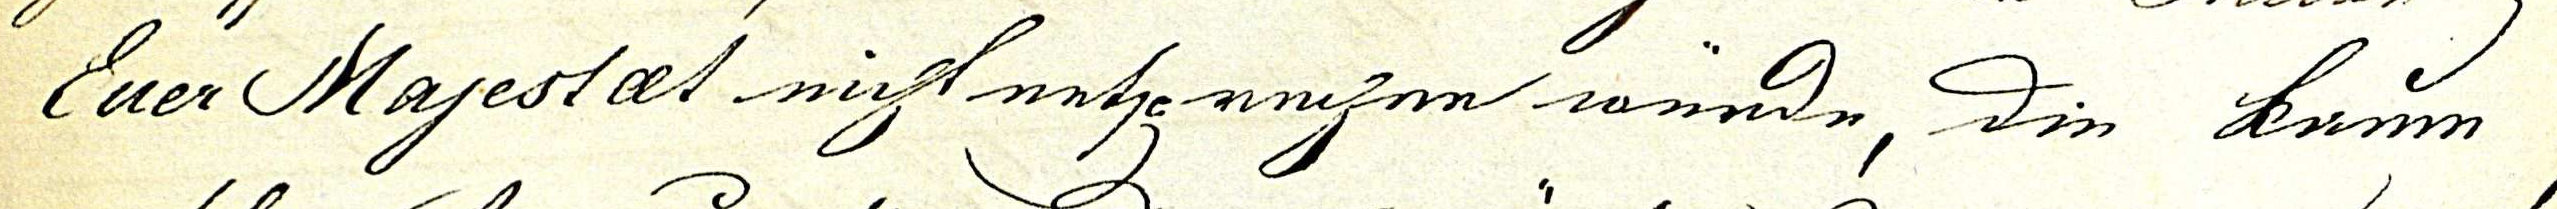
Euer Majestaet nicht entsprechen würde, die kaum
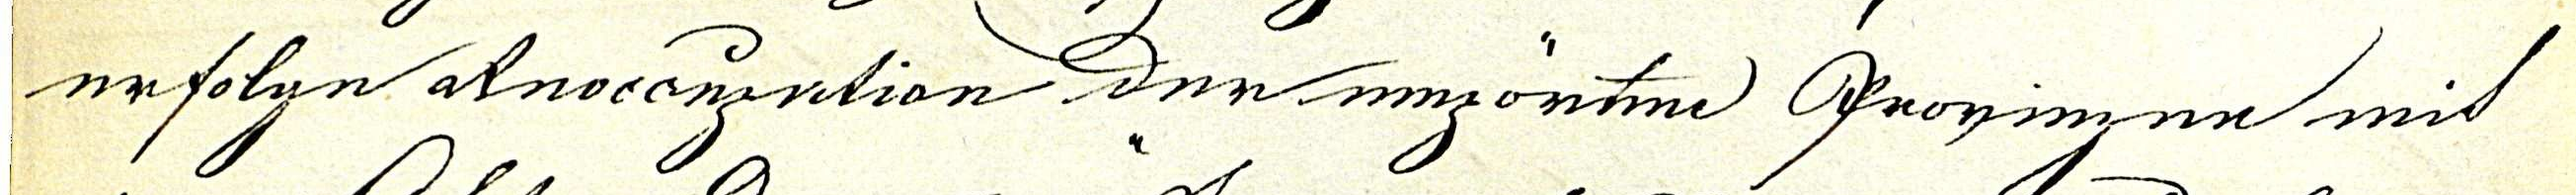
erfolge Reoccupation der empörte Provinzen mit
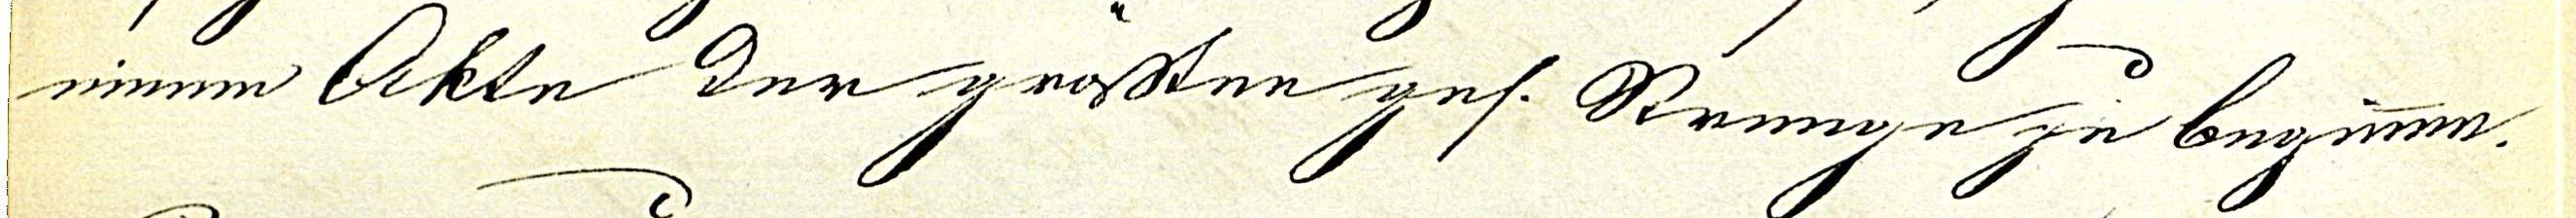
einem Akte der größten ges. Strenge zu beginnen.
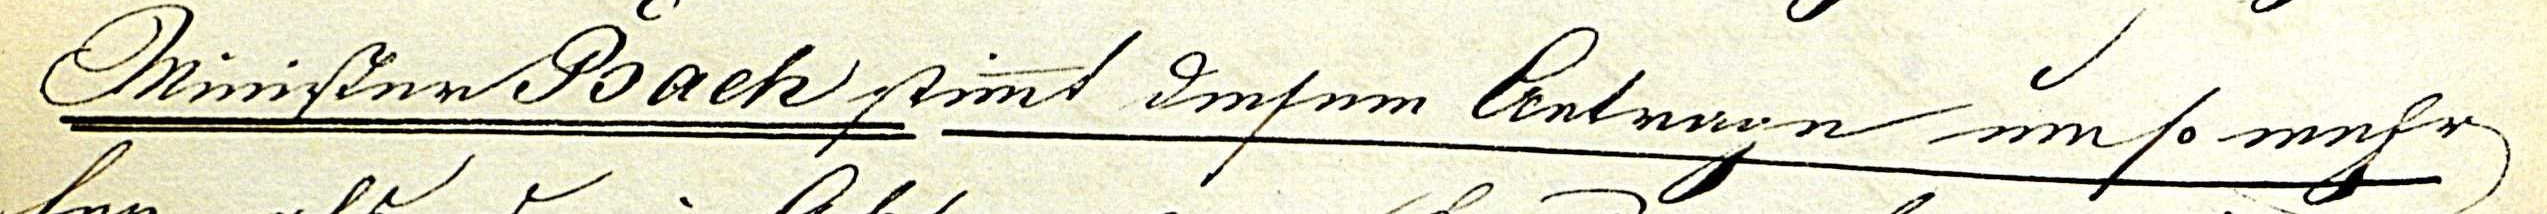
Minister Bach stimmt diesem Antrage umso mehr
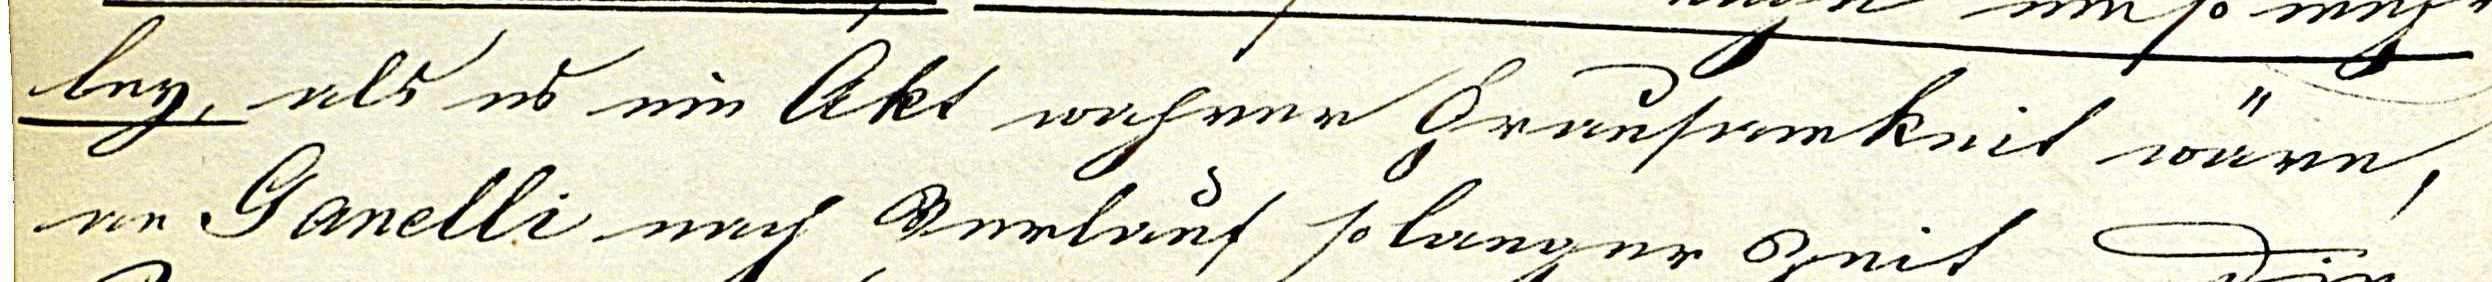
bey, als es ein Akt wahrer Grausamkeit wäre,
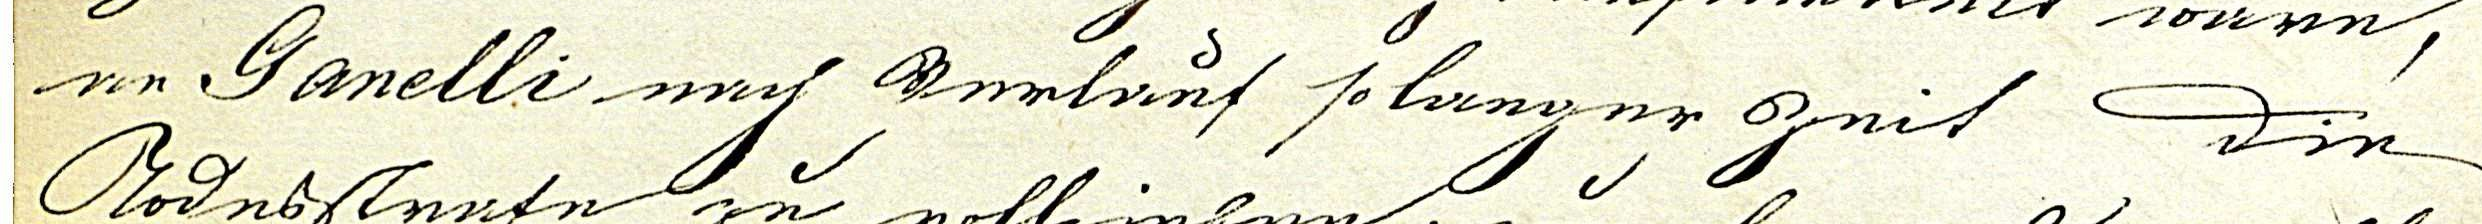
an Ganelli nach Verlauf so langer Zeit die
